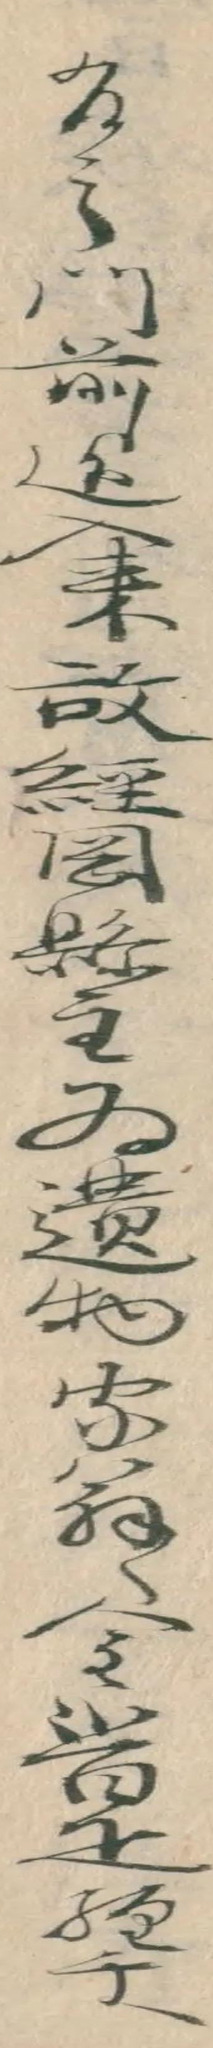有之門前迄入来故経岡縣主為遺物家翁へ金弐百疋経千ヘ
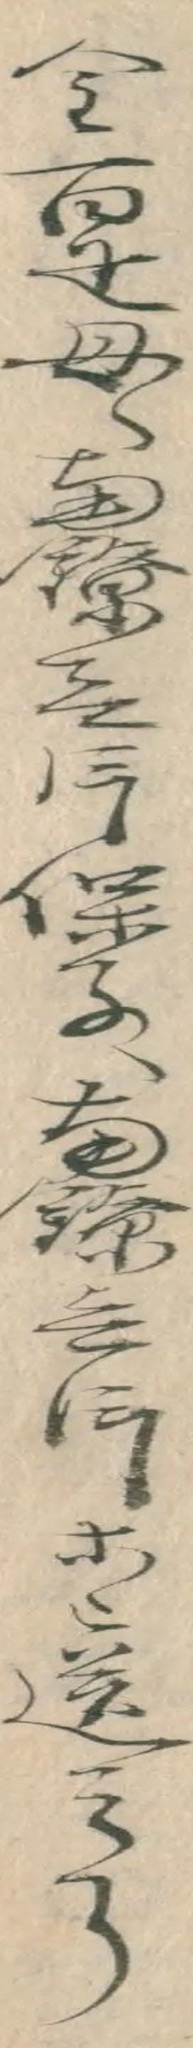金百疋母へ両鐐壱片保子へ両鐐壱片等被送之了
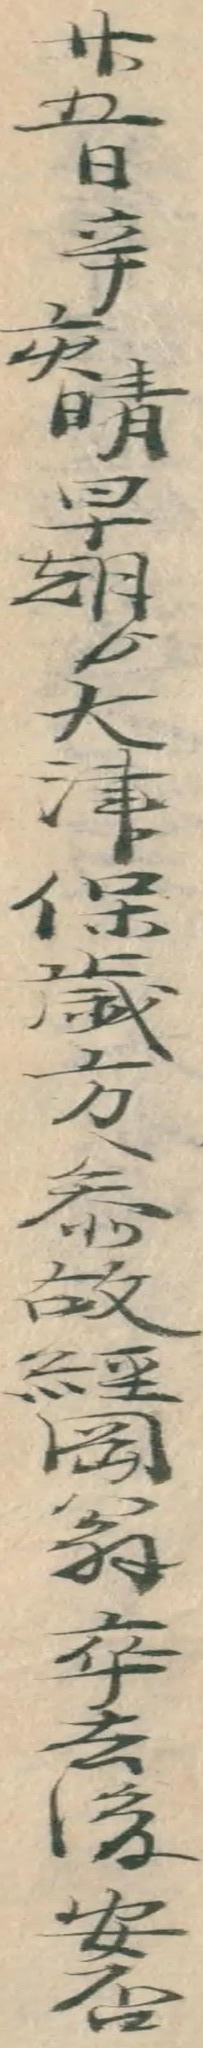廿五日辛亥晴早朝ゟ大津保歳方へ参故経岡翁卒去後安否

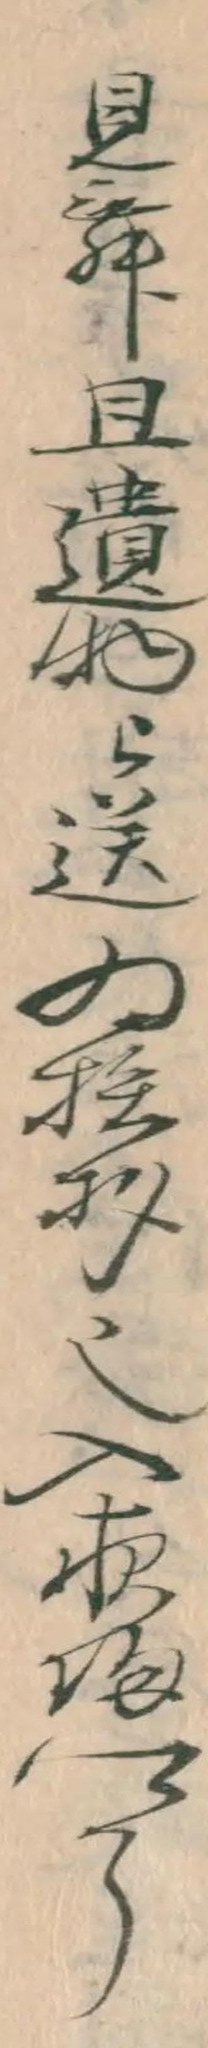見舞且遺物被送為挨拶也入夜帰郷了
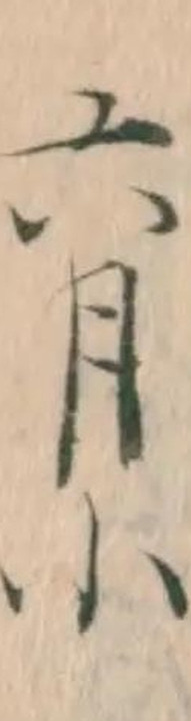六月小
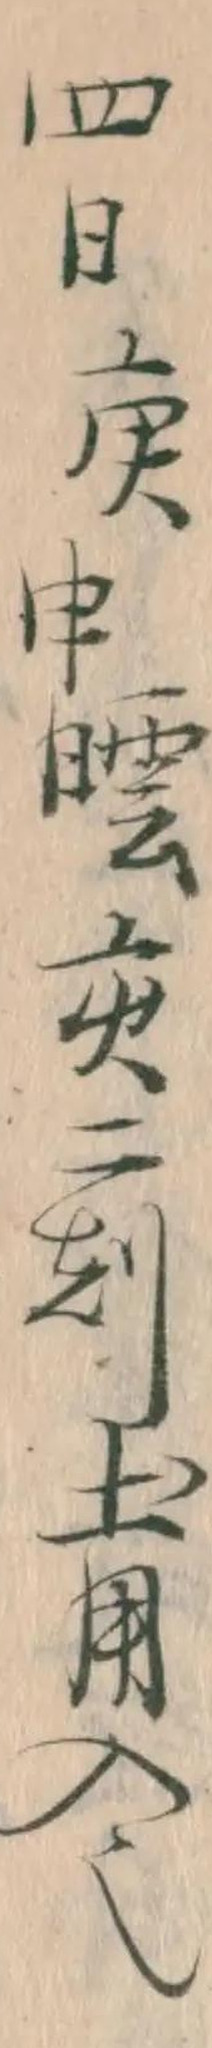四日庚申曇亥二刻出用入也
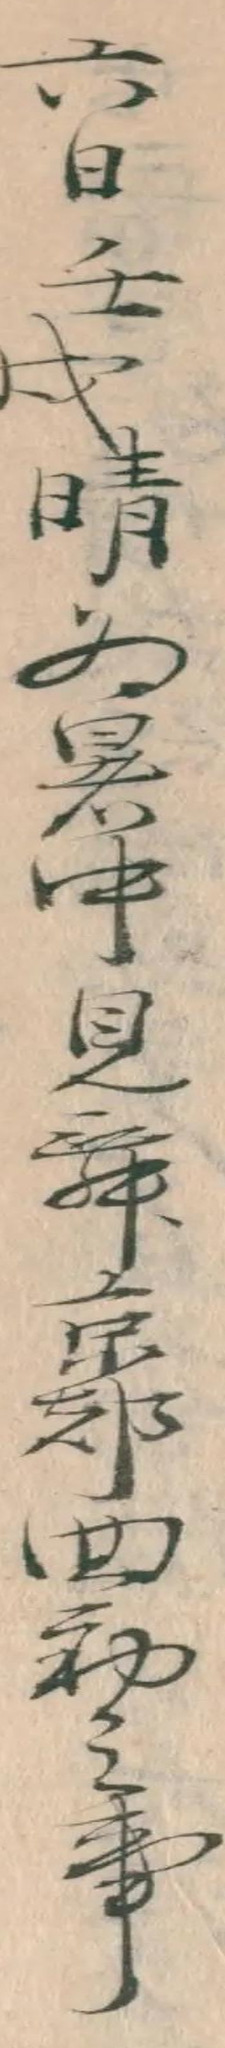六日壬戌晴為暑中見舞京都回勤之事
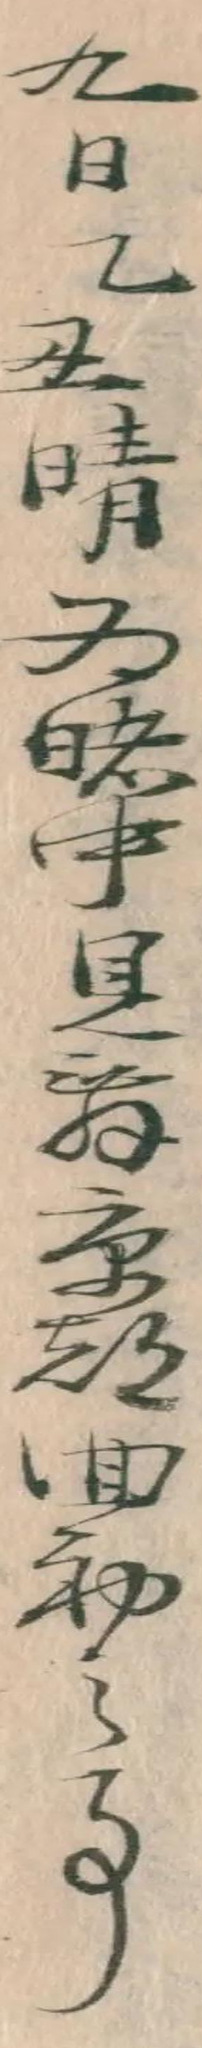九日乙丑晴為暁中見舞京都回勤之事
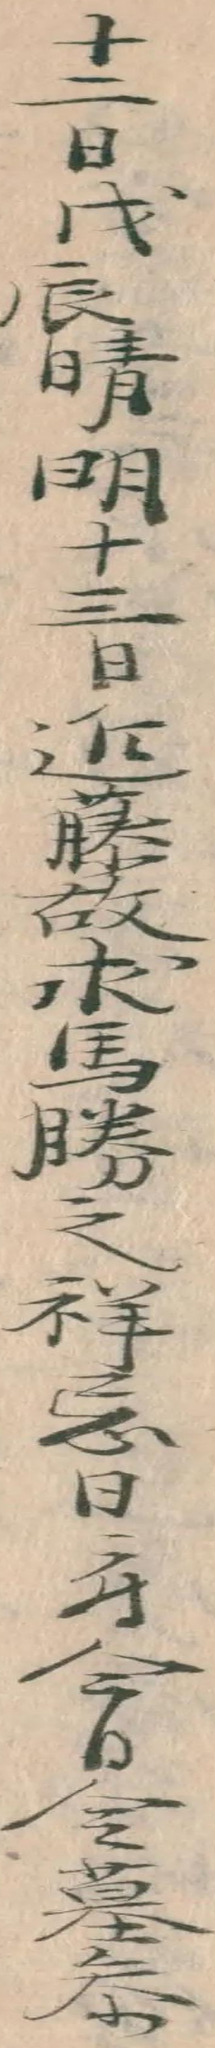十二日戊辰晴明十三日近藤故求馬勝之祥忌日ニ付今日令墓参
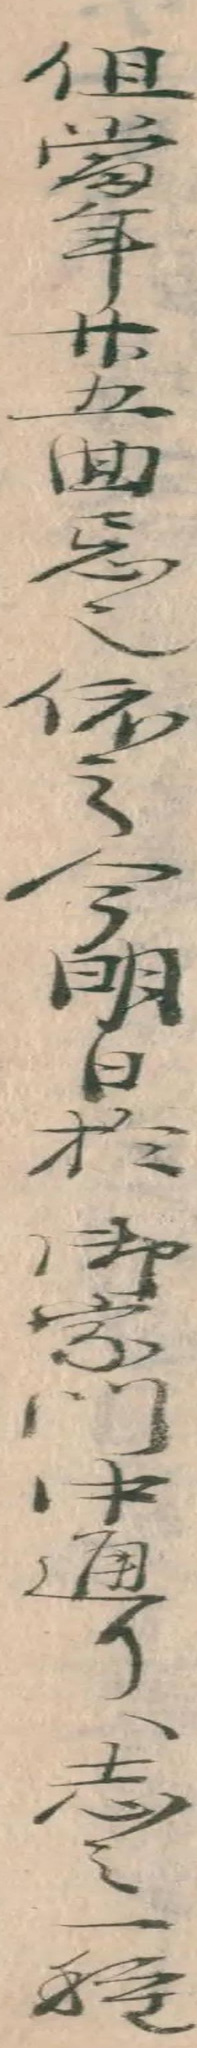但當年廿五回忌也依之今明日於御家門中通りへ志之一種
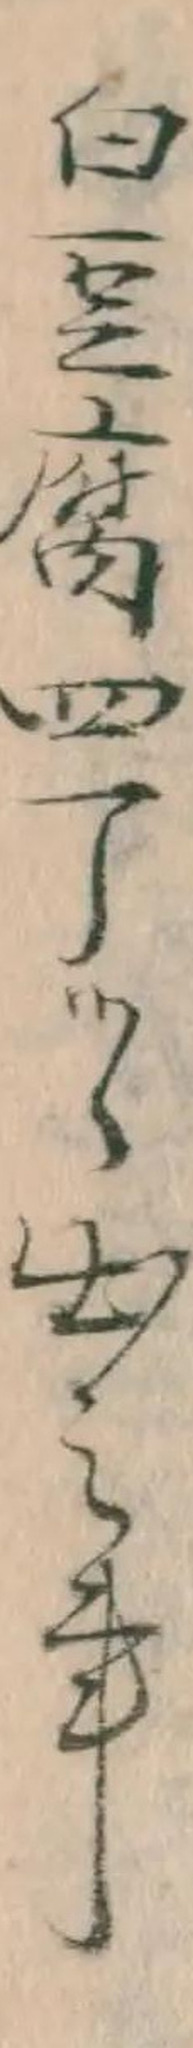白豆腐四丁ツヽ出之事
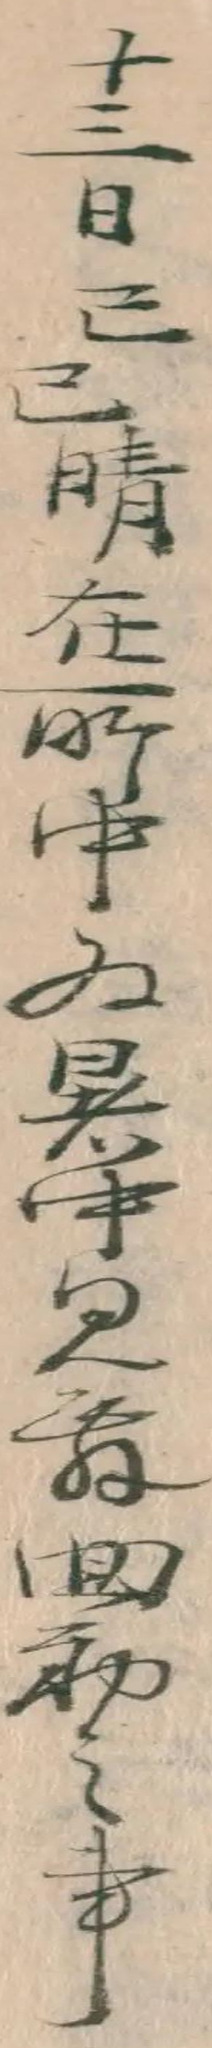十三日己巳晴在所中為暑中見舞回勤之事
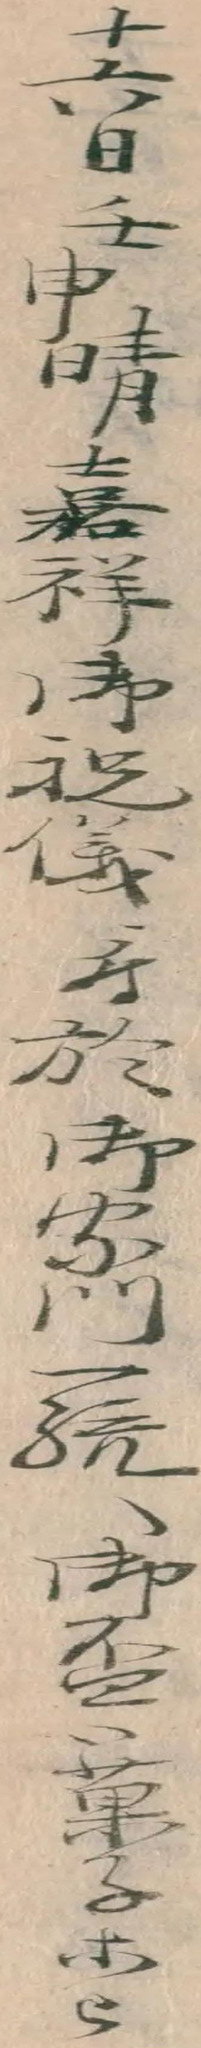十六日壬申晴嘉祥御祝儀ニ付於御家門一統へ御盃御菓子等被
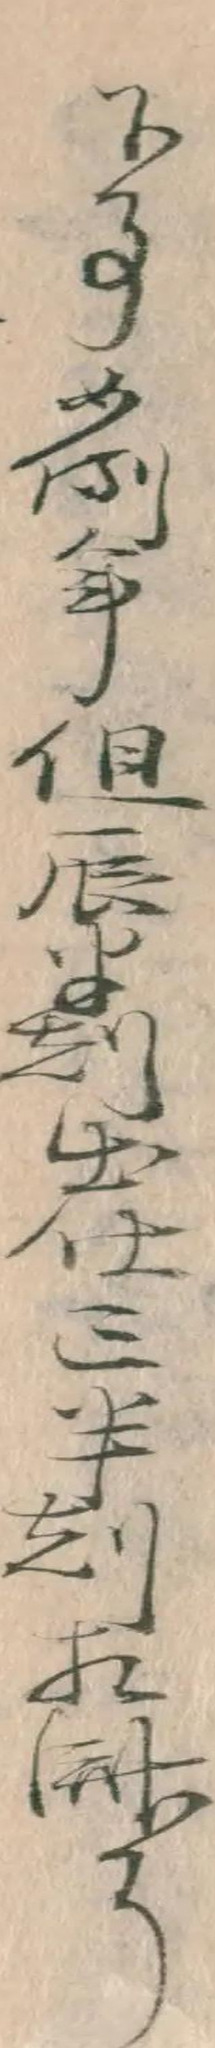下事前年但辰半刻出仕三半刻相済了
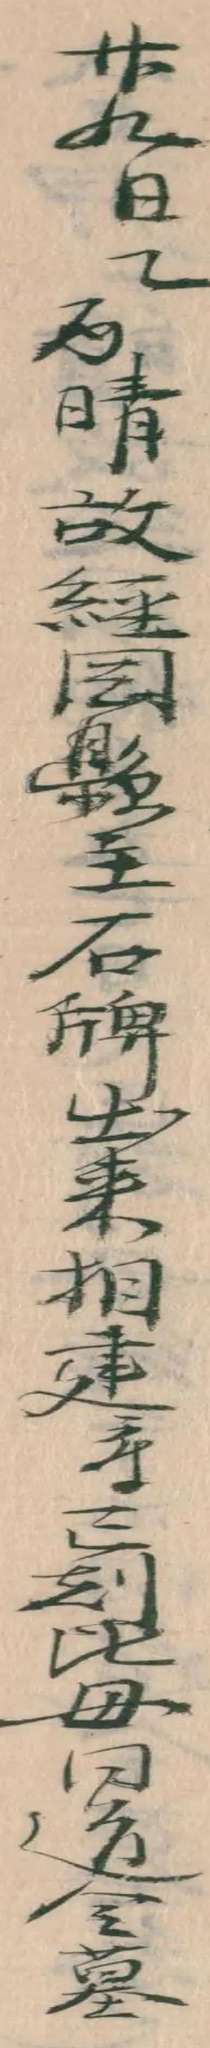廿九日乙酉晴故経岡縣主石碑出来相建ニ付巳刻比母同道令墓
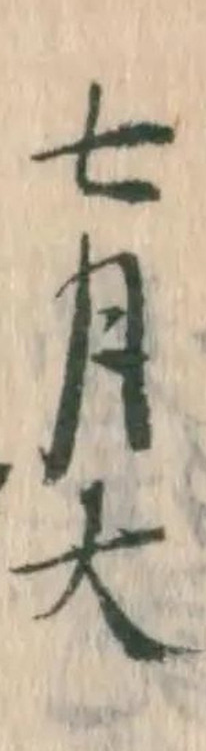七月大
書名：賀茂社記録. 第65冊
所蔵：国立国会図書館 National Diet Library, JAPAN
